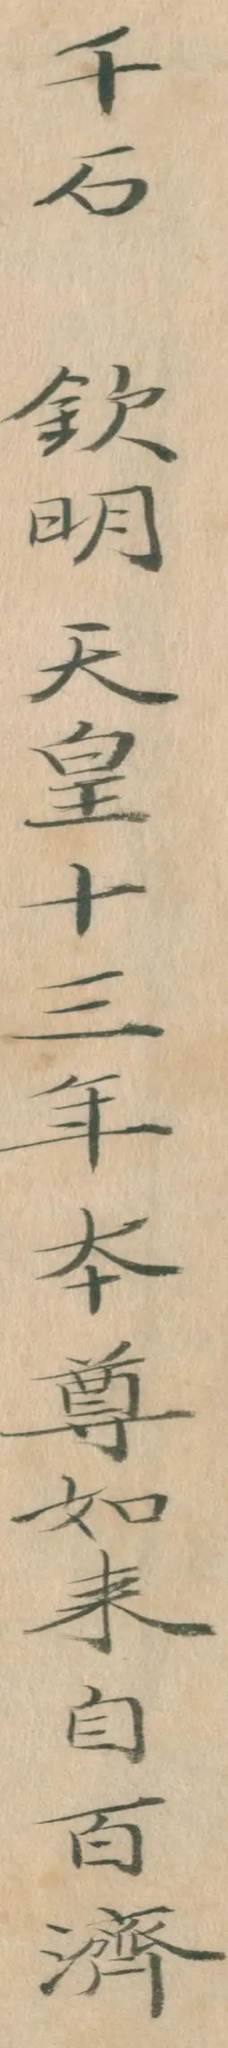千石欽明天皇十三年本尊如来自百済
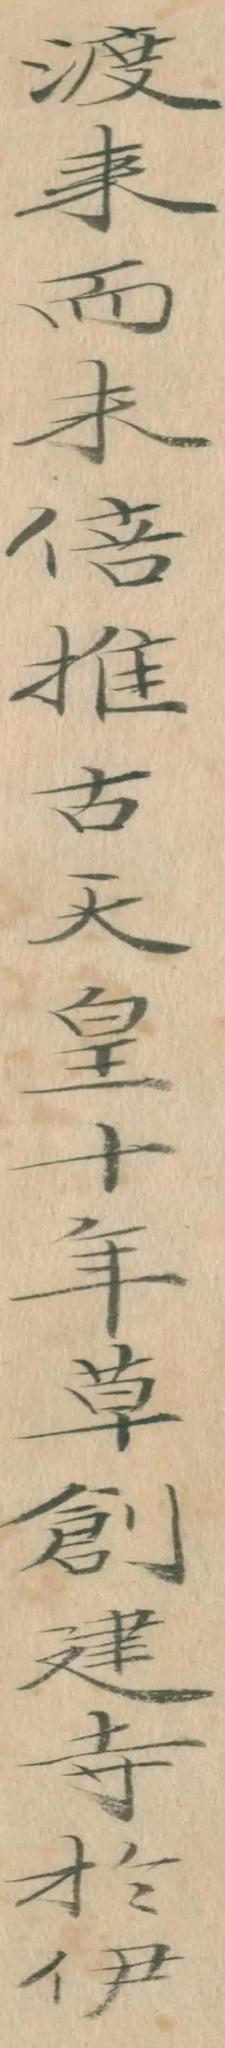渡来而未倍推古天皇十年草創建寺於伊
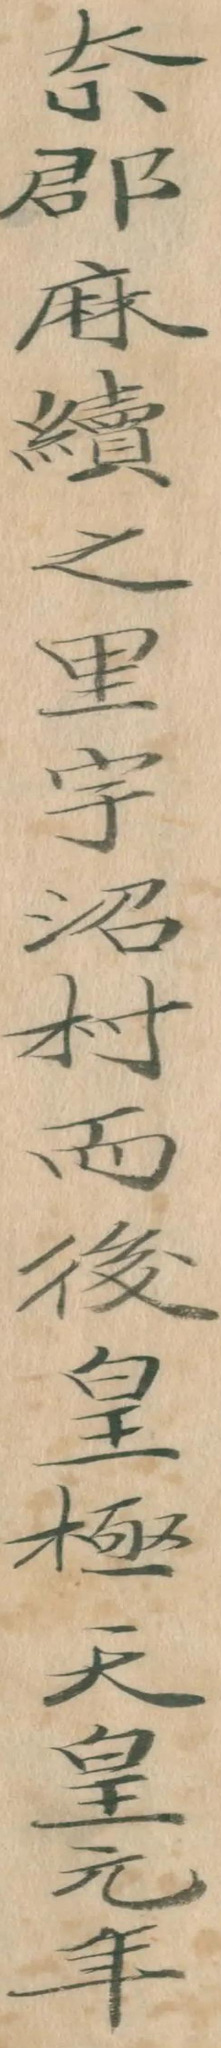奈郡麻続之里宇沼村而後皇極天皇元年
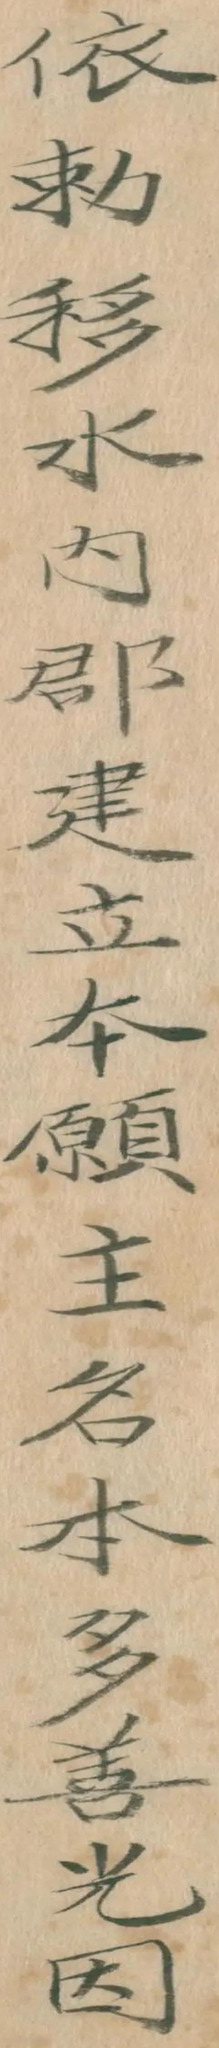依勅伊水内郡建立本願主名本多善光因
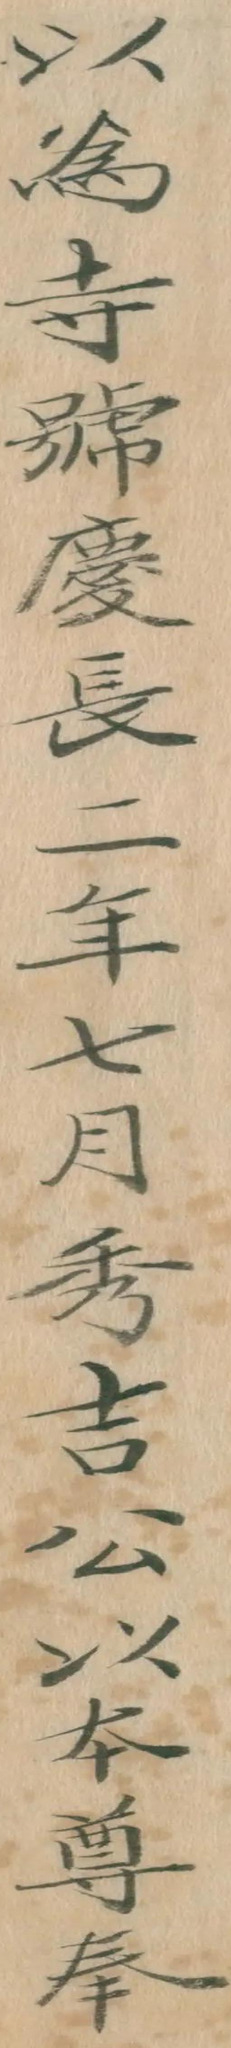以爲寺号慶長二年七月秀吉公以本尊奉
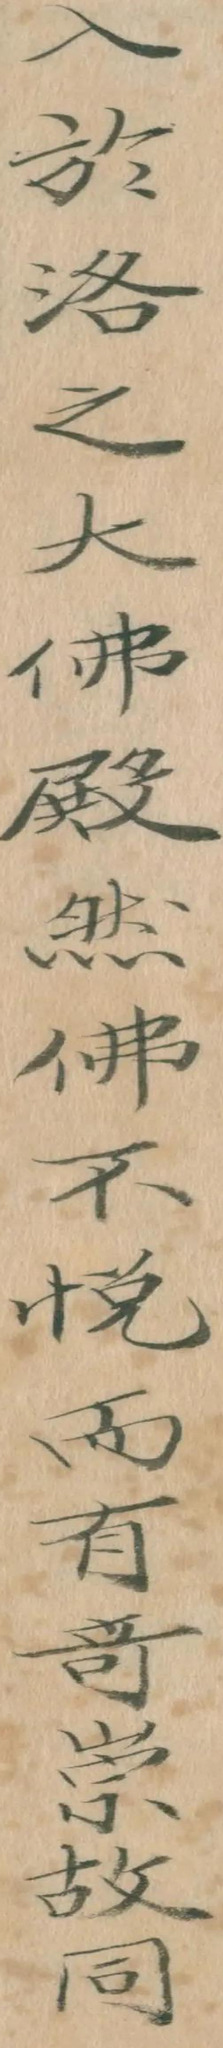入於洛之大仏殿然仏不悦而有奇崇故同
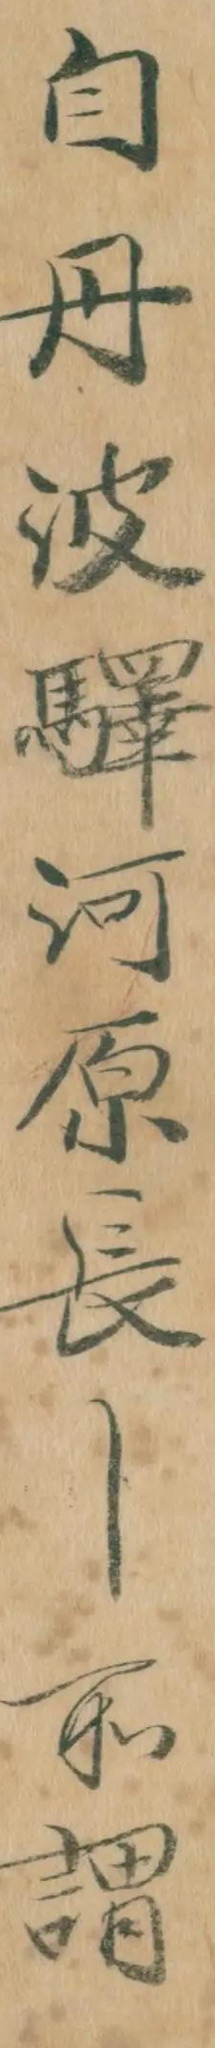自丹波駅河原長し所謂
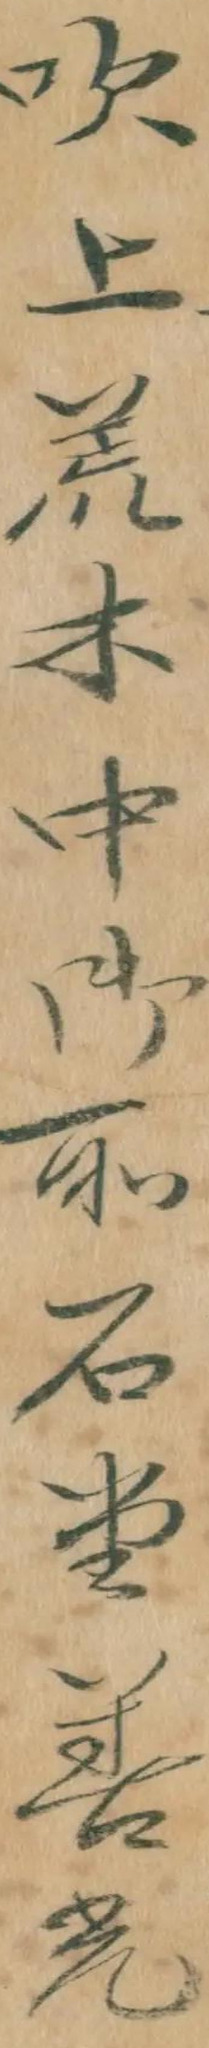吹上荒木中御所石堂善光
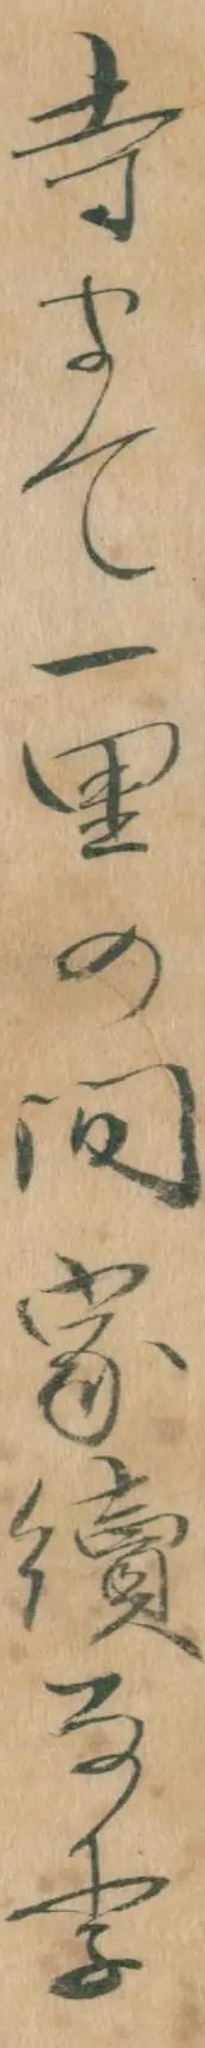寺まて一里の間家続る書
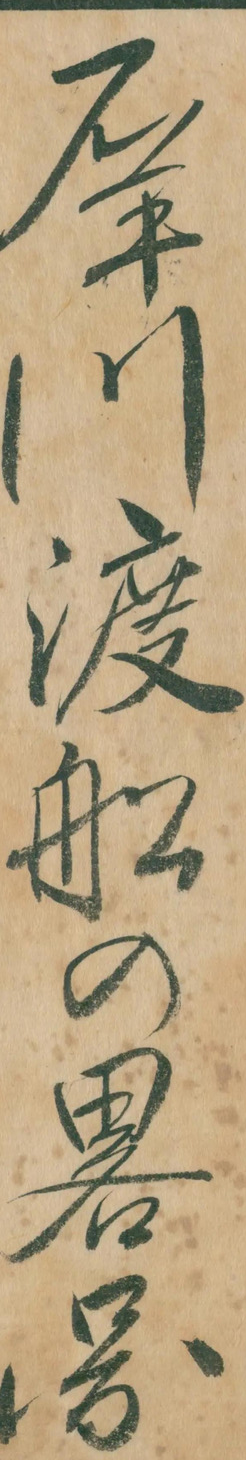犀川渡船の略図
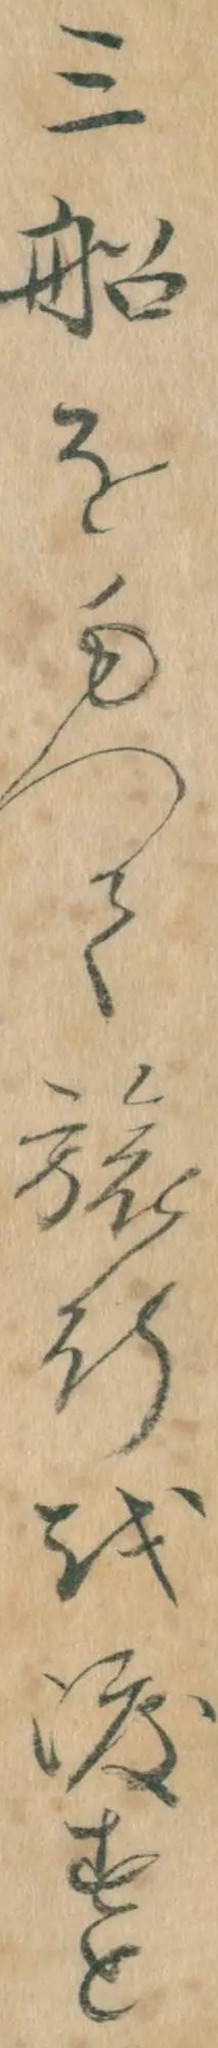三船をもつて旅行を渡すと
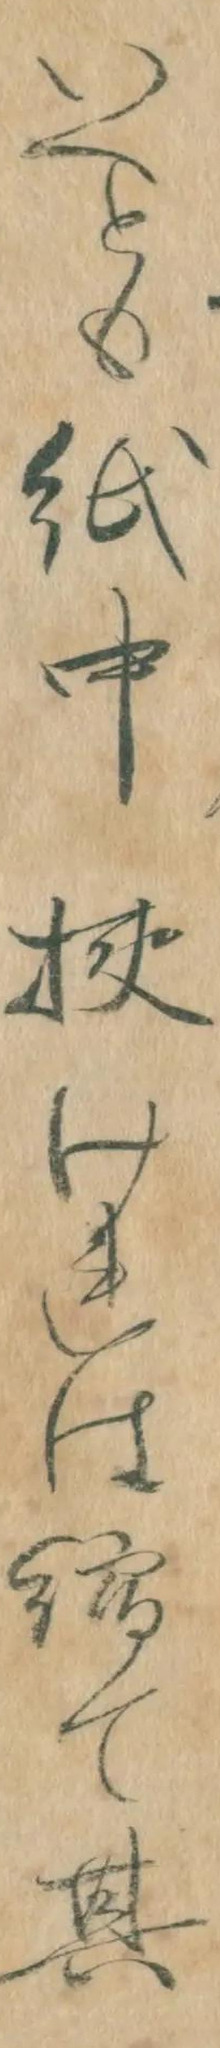いへとも紙中挟けれは縮て其
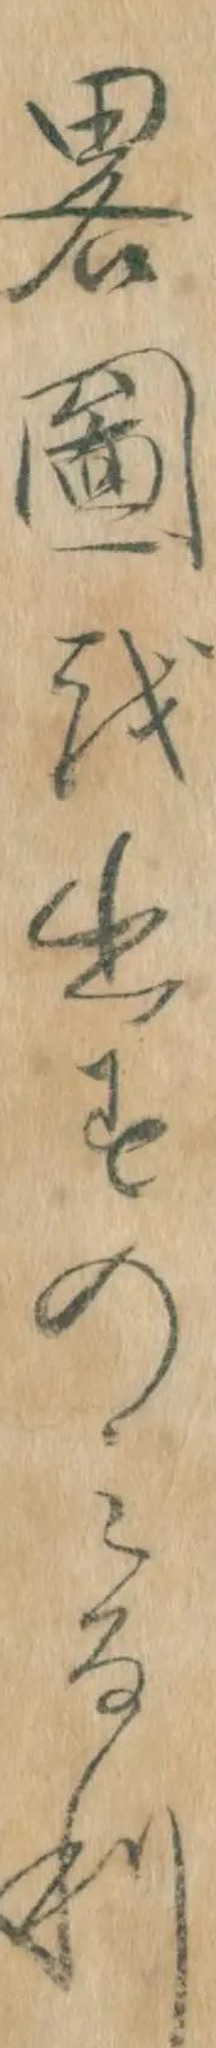略図を出すのみなり

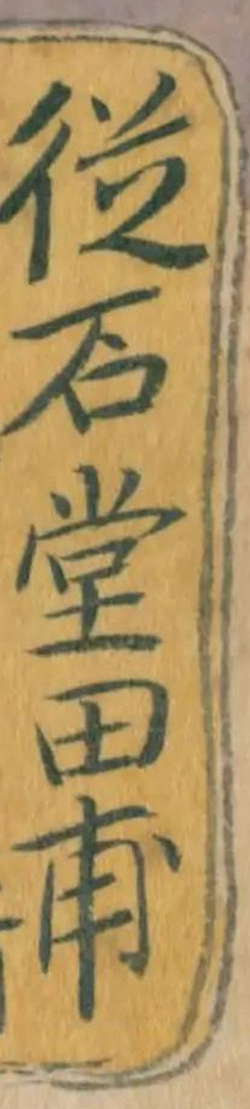従石堂田甫
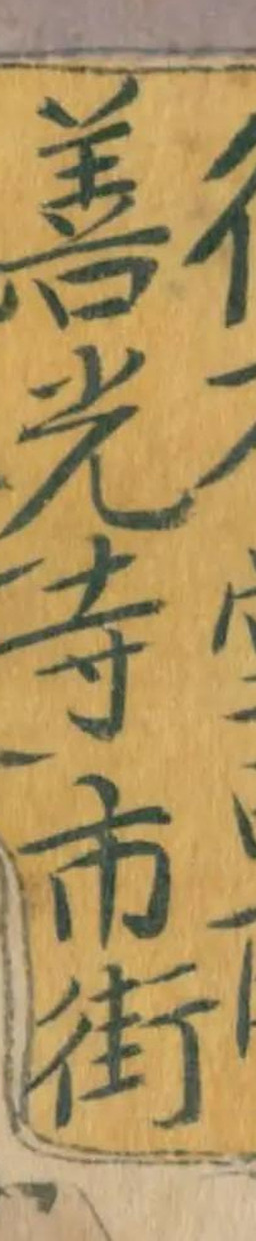善光寺市街
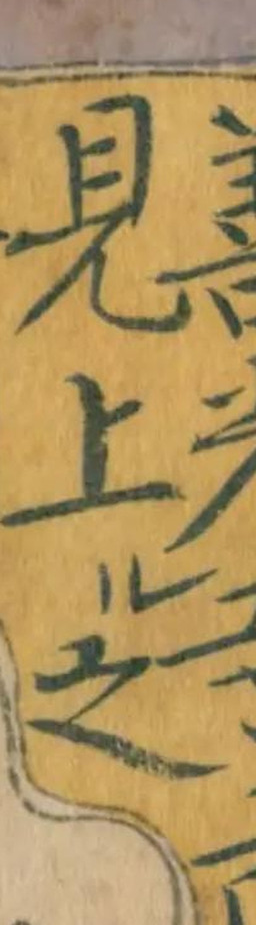見上ル之
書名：俗語之種. [1]
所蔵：国立国会図書館 National Diet Library, JAPAN
